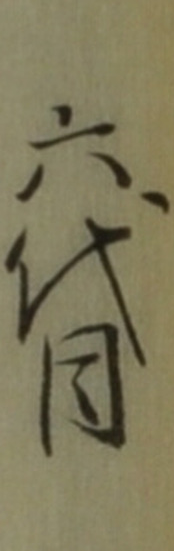六代目
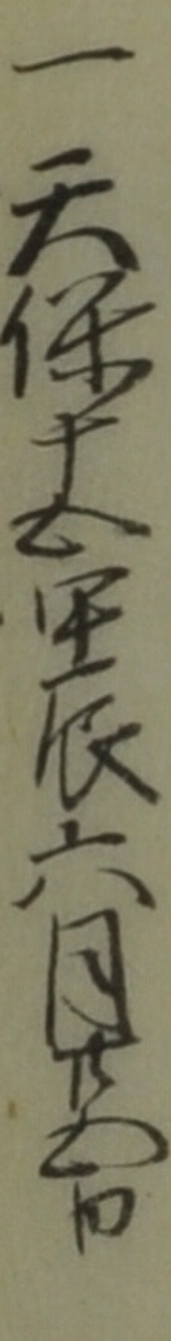一天保治十五甲辰六月廿五日
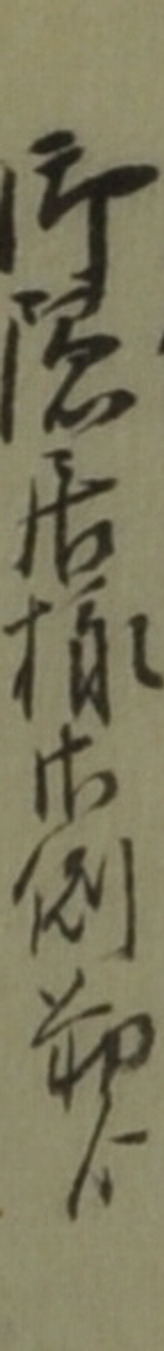御隠居様御側勤ゟ
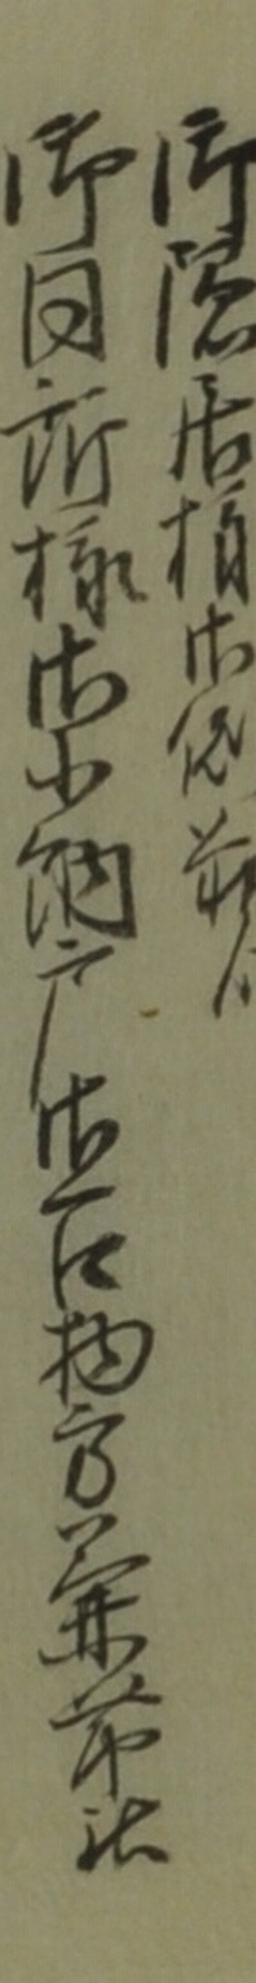御同所様御小納戸御召物方兼帯被
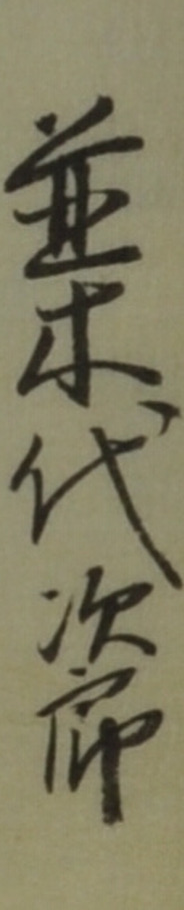並木代次郎
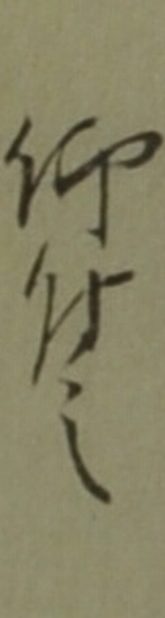仰付之
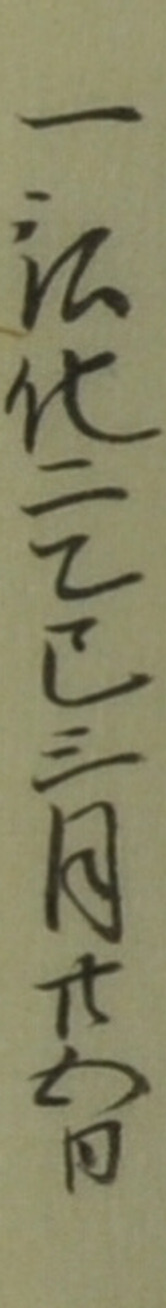一弘化二乙巳三月廿五日
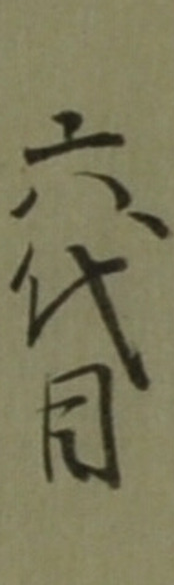六代目
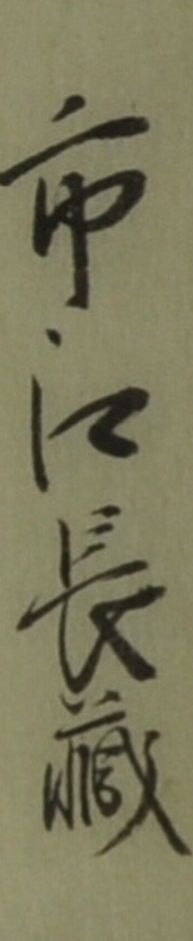市江長蔵

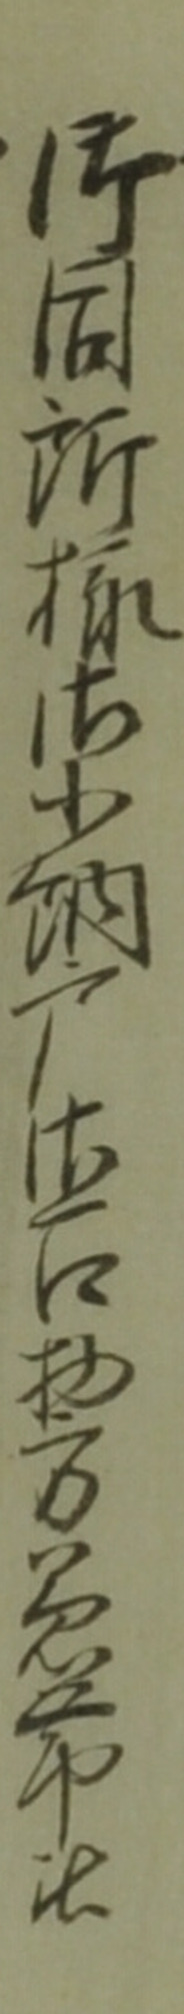御同所様御小納戸御召物方兼帯被
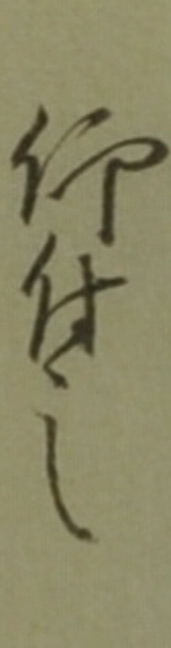仰付之
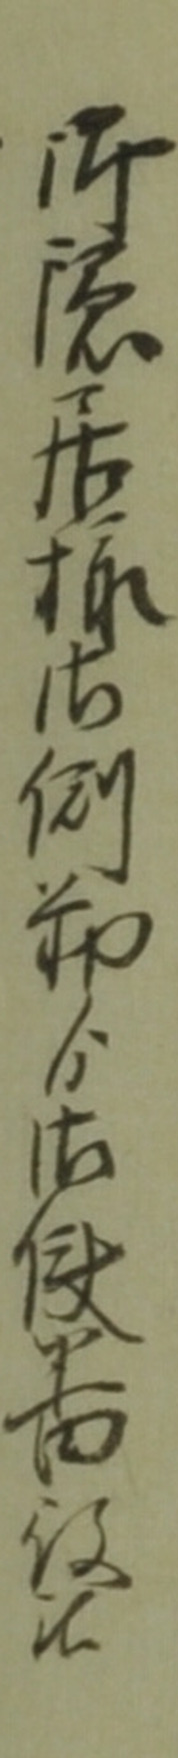御隠居様御側勤ゟ御使番役被
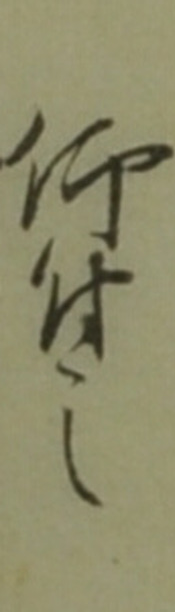仰付之
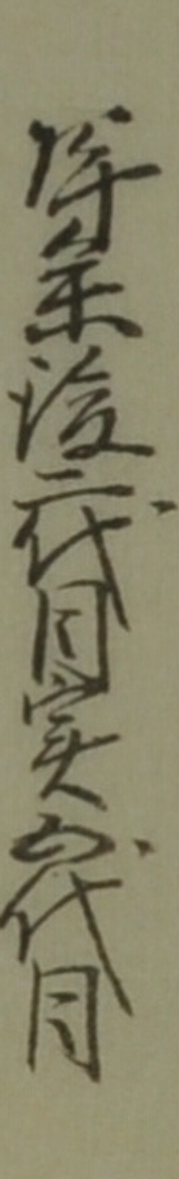帰参後二代目実五代目
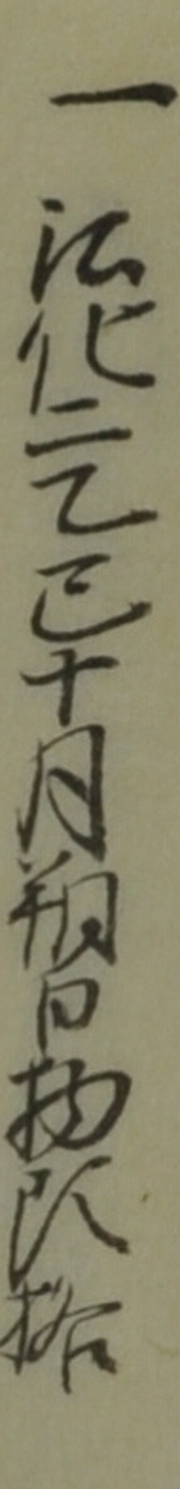一弘化二乙巳十月朔日物頭格
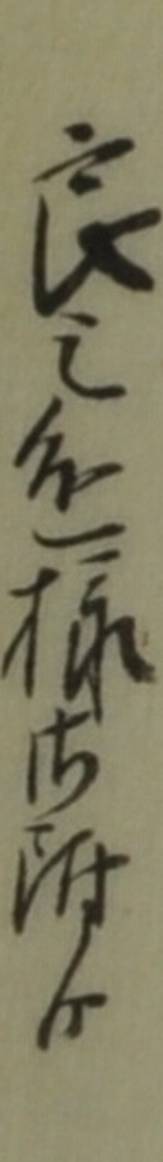良之進様御附ゟ
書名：諸御役代々録（四）
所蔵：伊那市立高遠町図書館・合同会社AMANE
